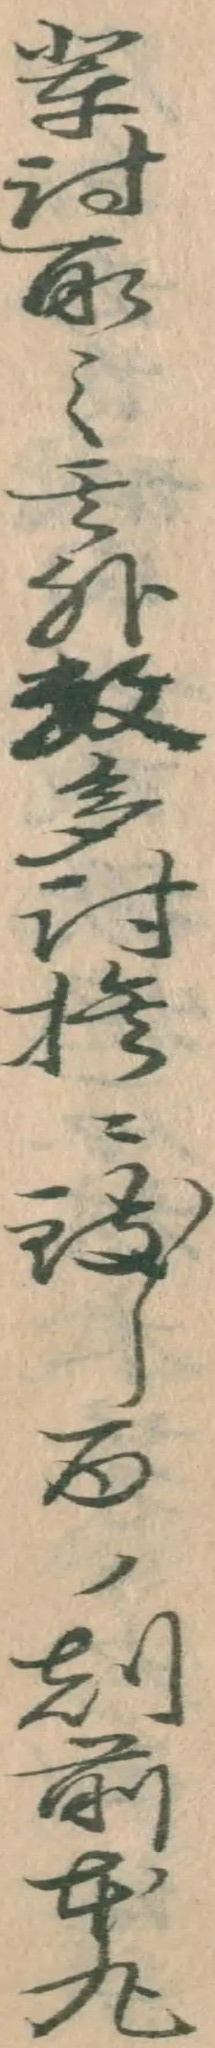輩討取之其外数多討捨に致し酉之刻前本丸
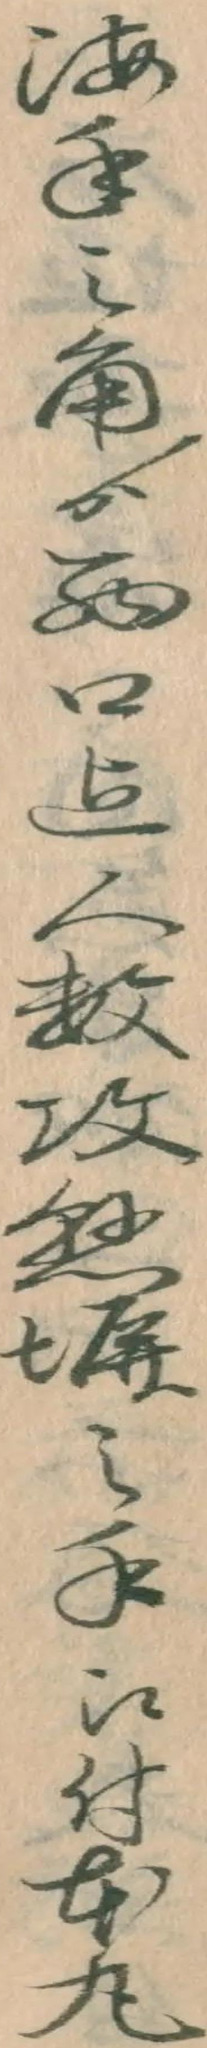海手之角ゟ西口迄人数攻懸塀之手江付本丸

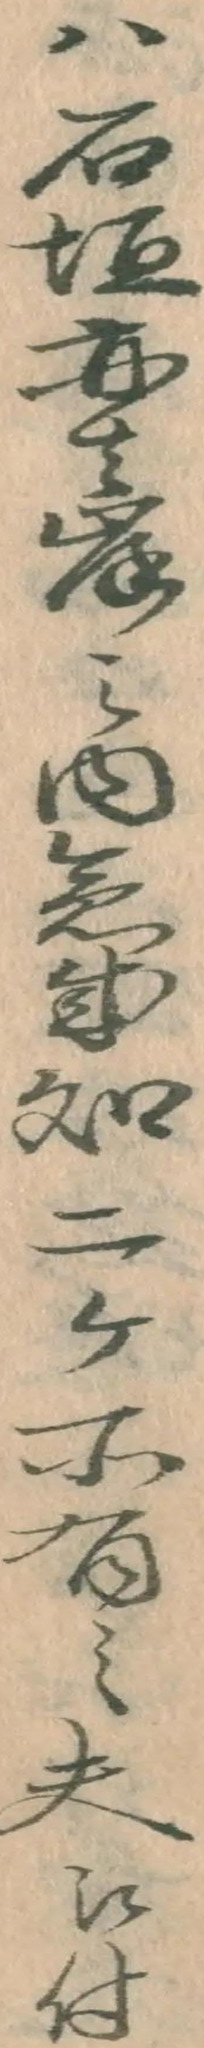は石垣亦者岸之内急成処二け所有之夫江付
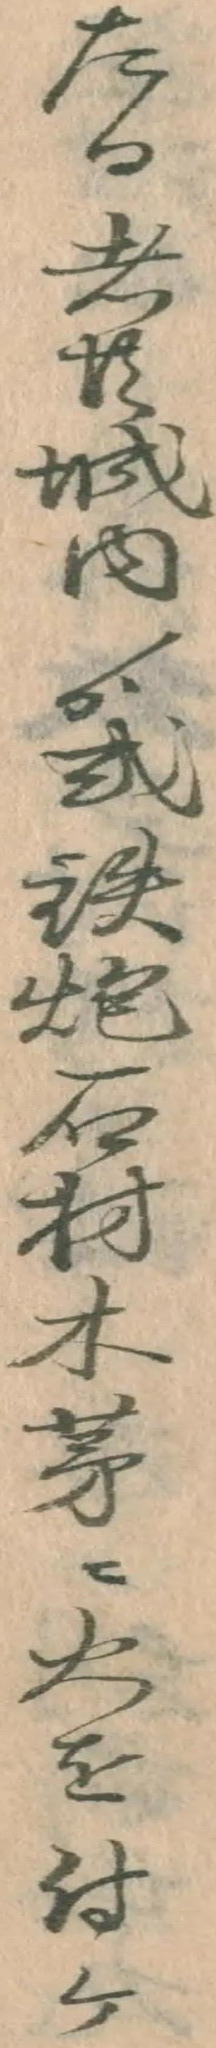たる者共城内ゟ或鉄砲石材木茅に火を付け
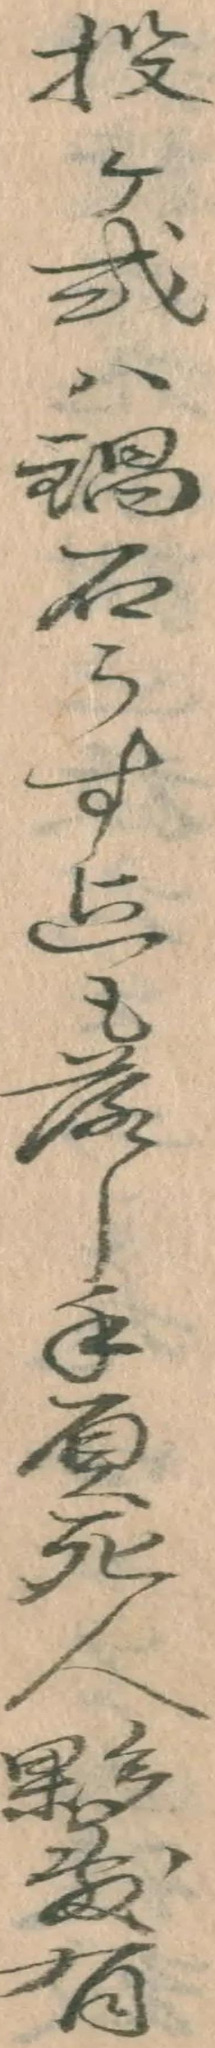投け或は鍋石うす迄も落し手負死人夥敷有
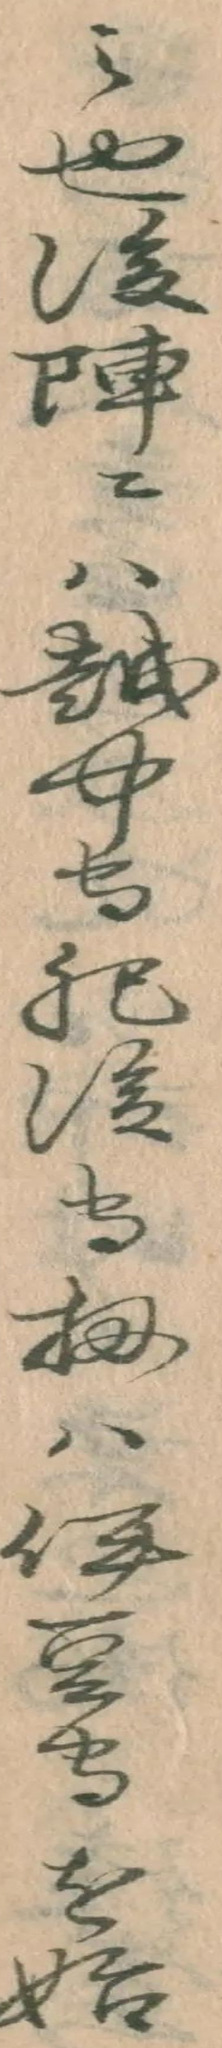之也後陣には越中守肥後守扨は伊豆守を始
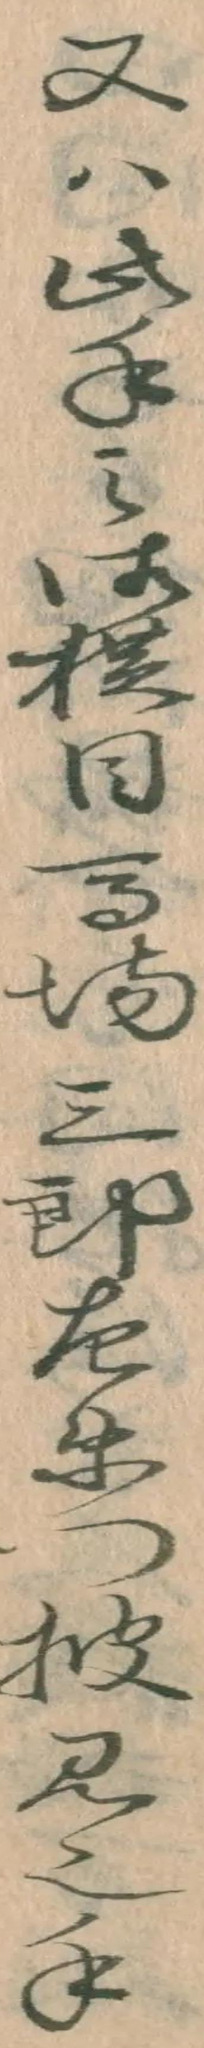又は此手之御横目馬場三郎左衛門披見也手
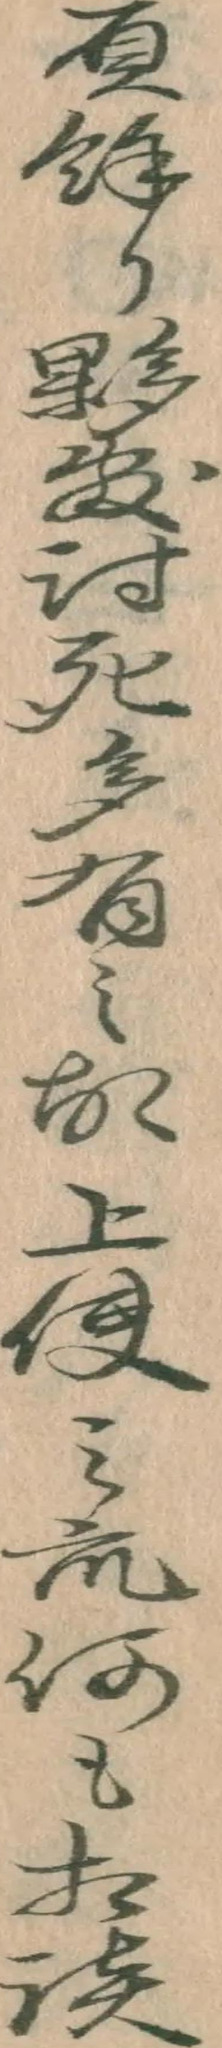負余り夥敷討死多有之故上使之衆何も相談
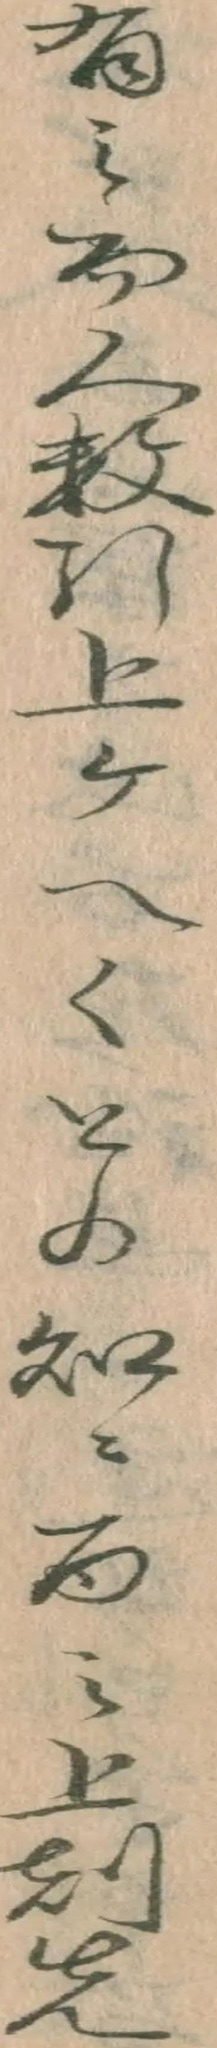有之而人数引上けへくとの処に酉之上刻先
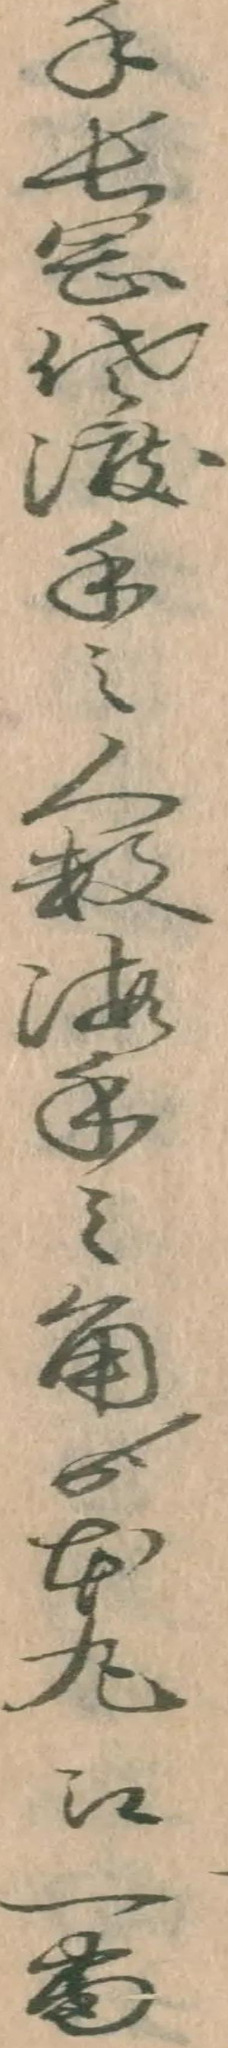手長岡佐渡手之人数海手之角ゟ本丸江一番
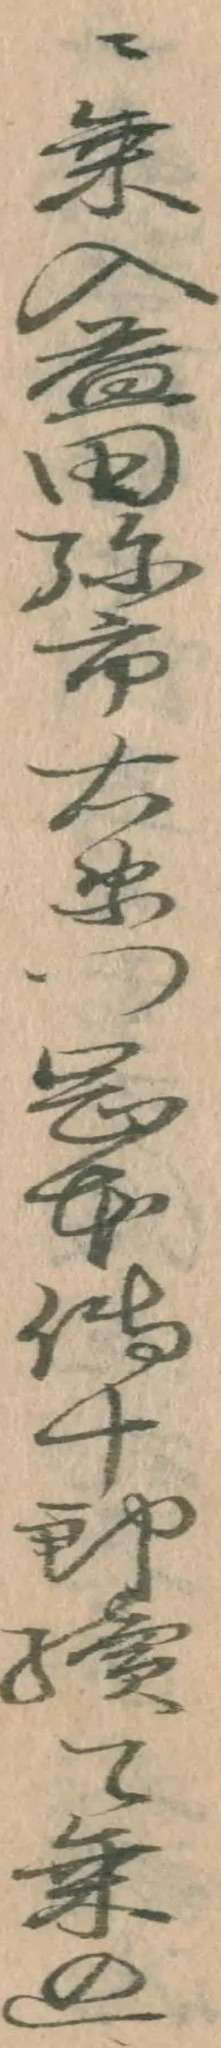に乗入益田弥市右衛門岡本伝十郎続て乗込
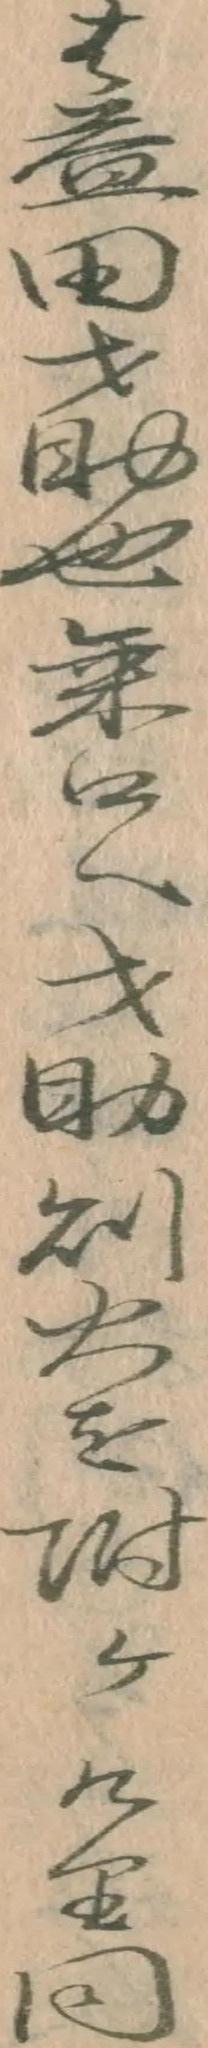者益田才助也乗口へ才助則火を附け介里同
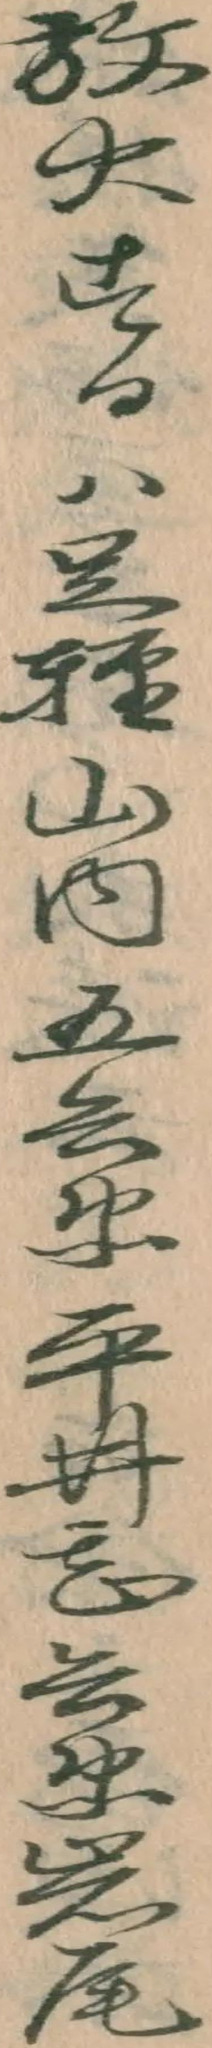放火春るは足軽山内五兵衛平井甚兵衛岩尾
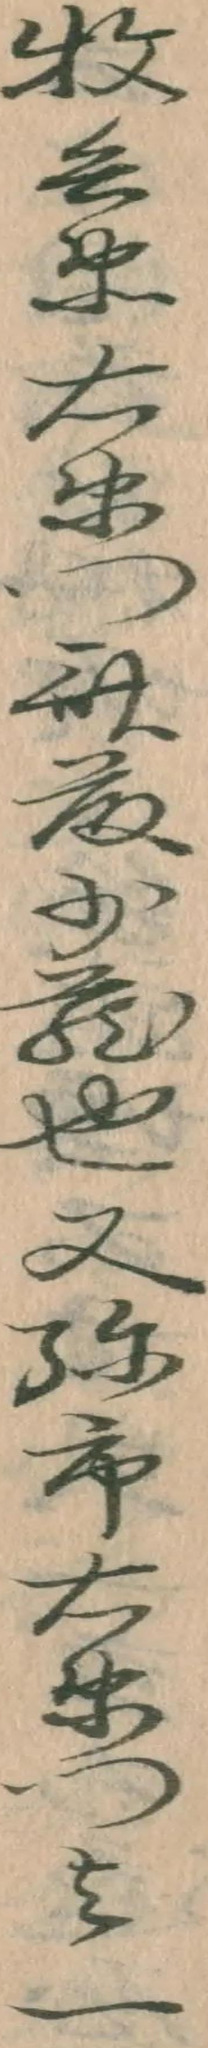牧兵衛右衛門斎藤少蔵也又弥市右衛門与一
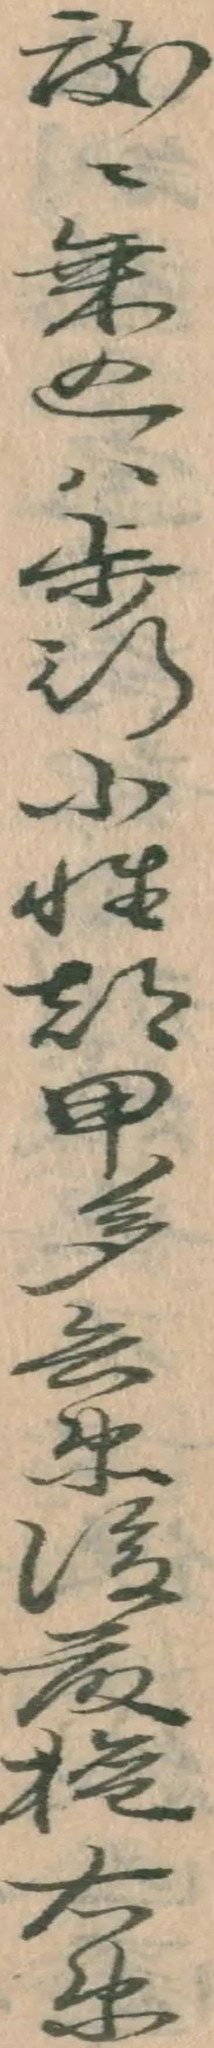度に乗込は歩行小姓都甲多兵衛後藤権右衛
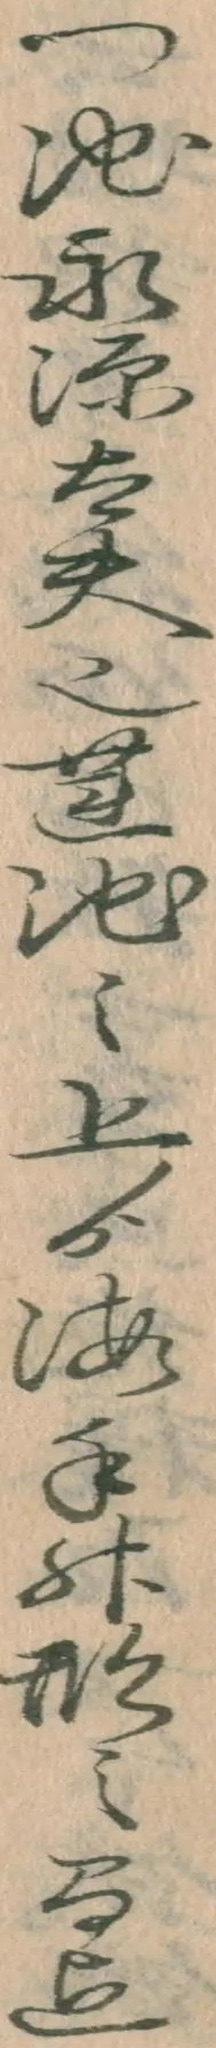門池永源太夫也蓮池之上ゟ海手舛形之間迄
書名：切支丹御退治記 49巻. [8]
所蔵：国立国会図書館 National Diet Library, JAPAN
